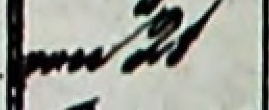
von 21
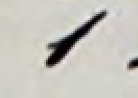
1
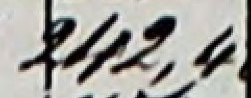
242,4
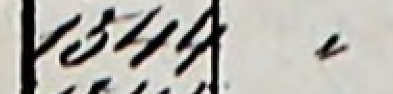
1544 „
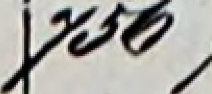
756
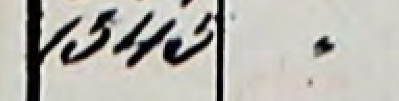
1545 „
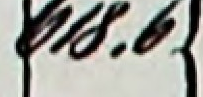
618,6
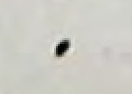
.
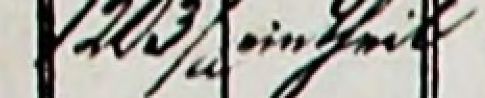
1203/a ein Theil
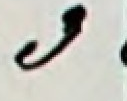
3
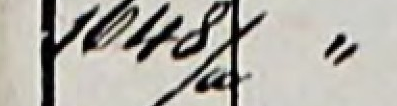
1648/a „
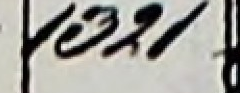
1321
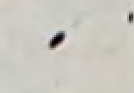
.
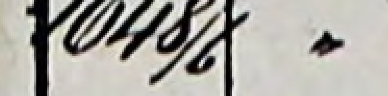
1648/b „
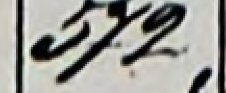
572
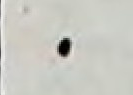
.
